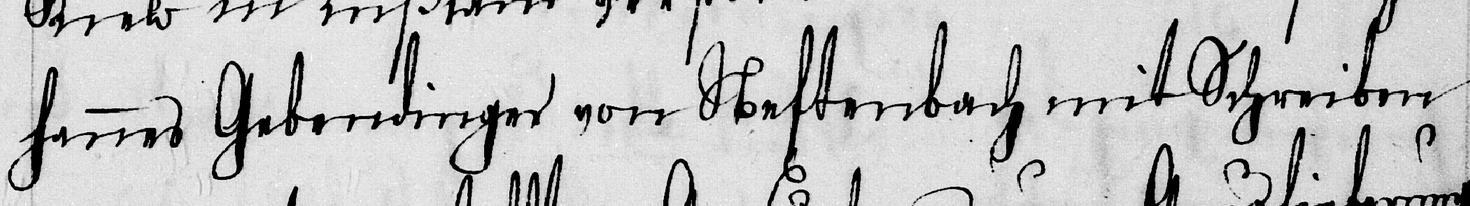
hannes Gebendinger von Neftenbach mit Schreiben
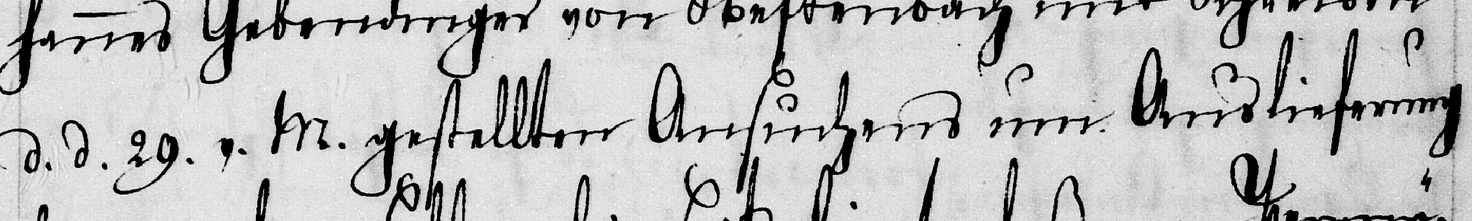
d. d. 29. v. M. gestellten Ansuchens um Auslieferung
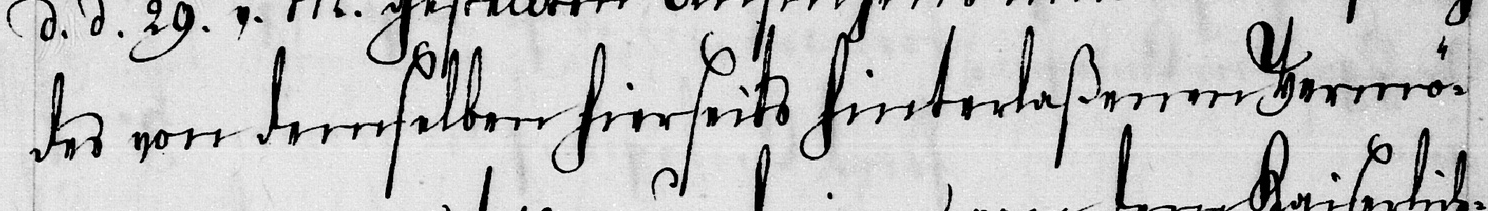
des von demselben hierseits hinterlaßenen Vermö¬
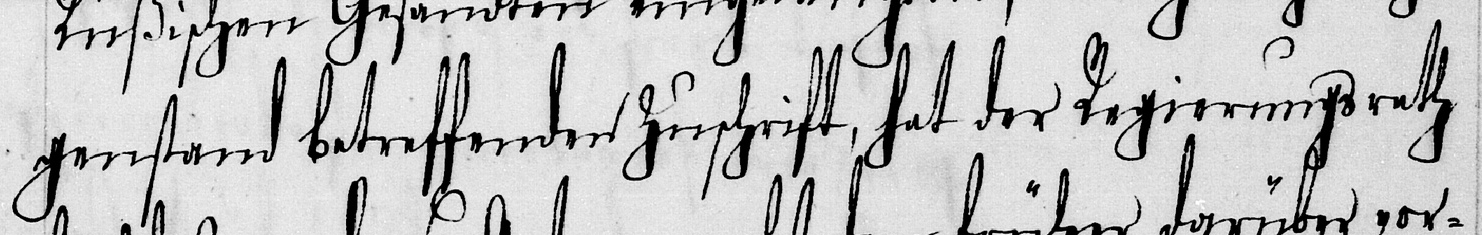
betreffenden Zuschrift, hat der Regierungsrath
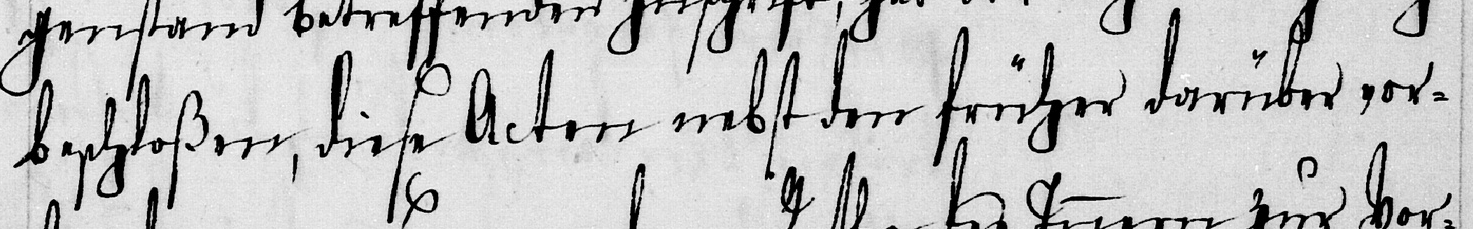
beschloßen, diese Acten nebst den früher darüber vor¬
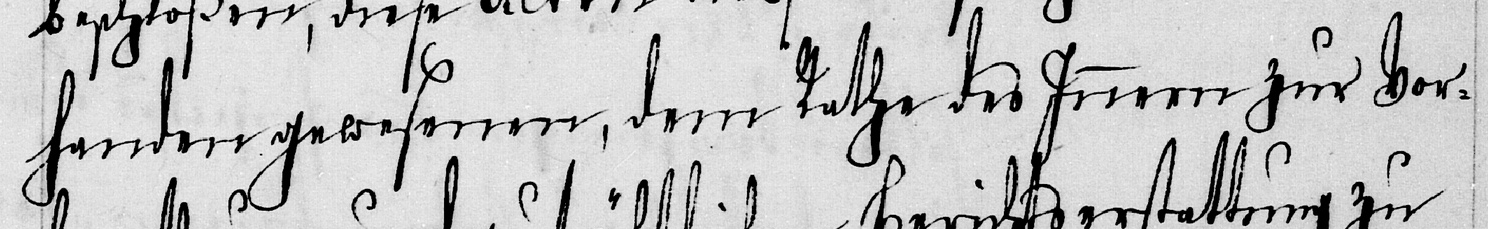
handen gewesenen, dem Rathe des Innern zur Vor¬
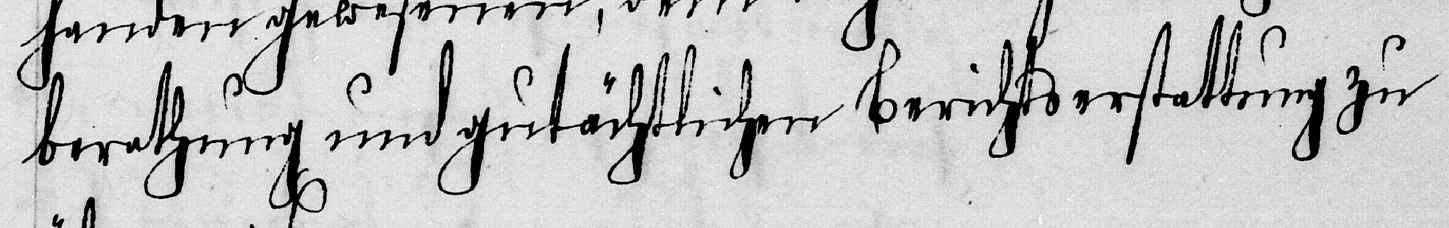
berathung und gutächtlichen Berichterstattung zu
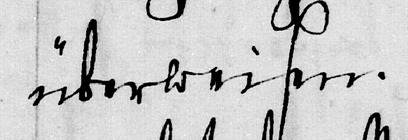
überweisen.
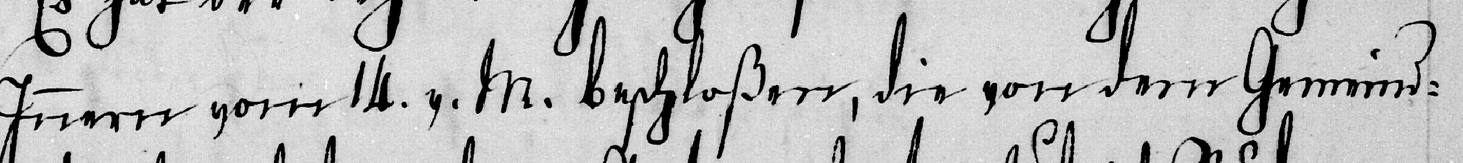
Innern vom 14. v. M. beschloßen, die von dem Gemeindr¬
